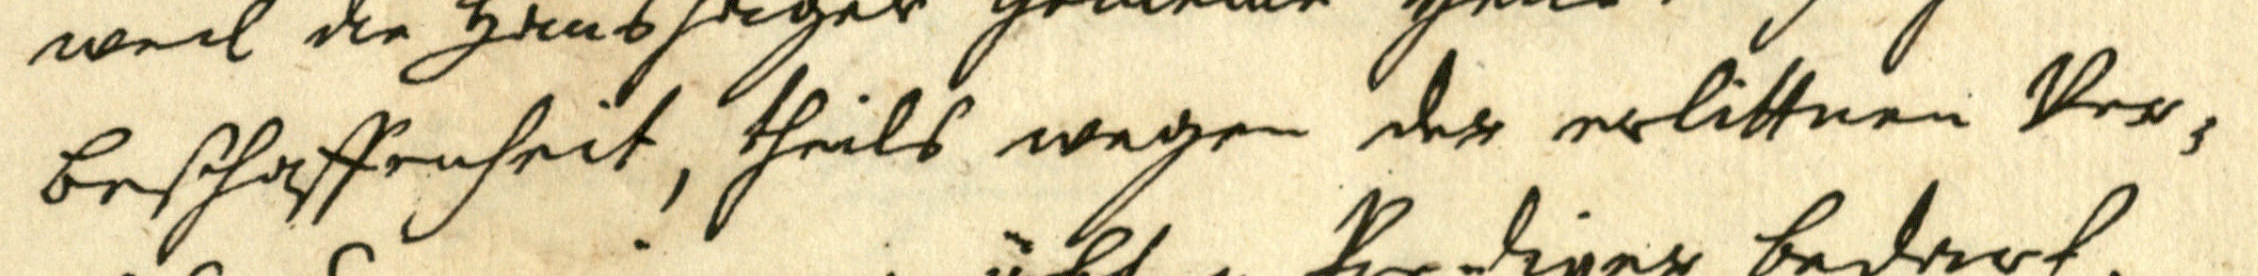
Beschaffenheit, theils wegen der erlittnen Ver¬
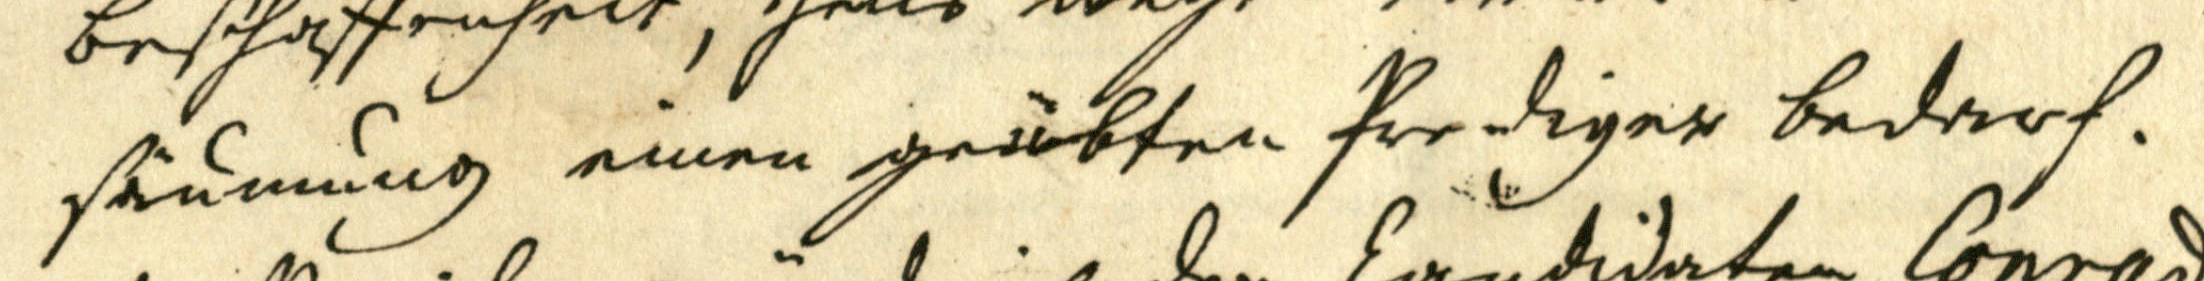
säumung einen geübten Prediger bedarf.
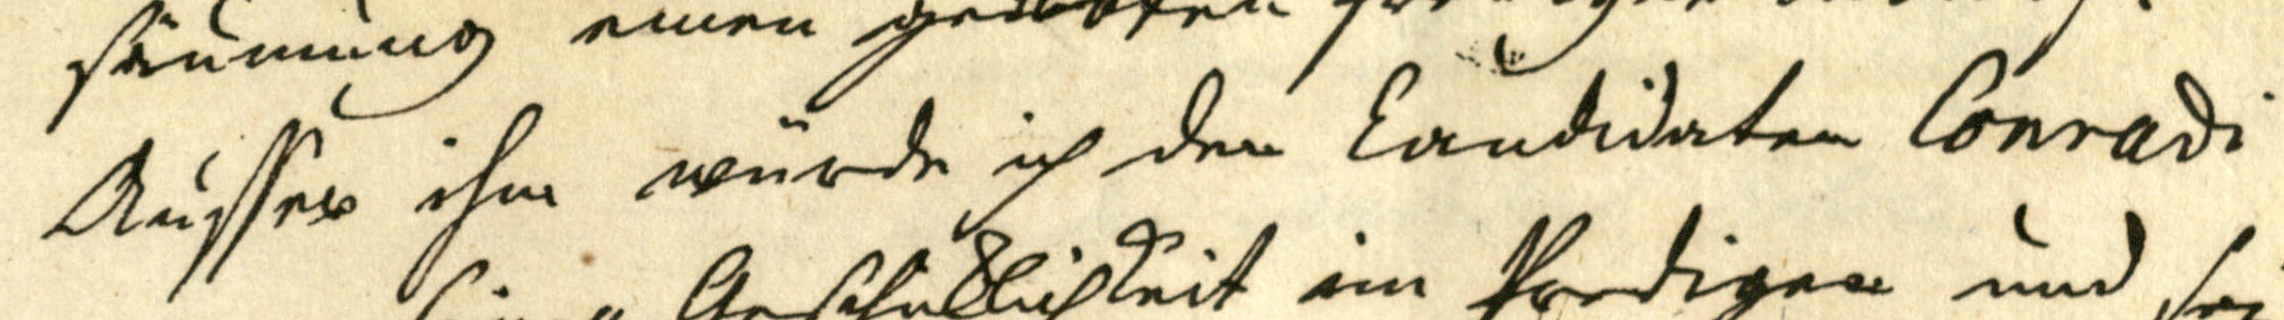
Ausser ihm würde ich den Candidaten Conradi
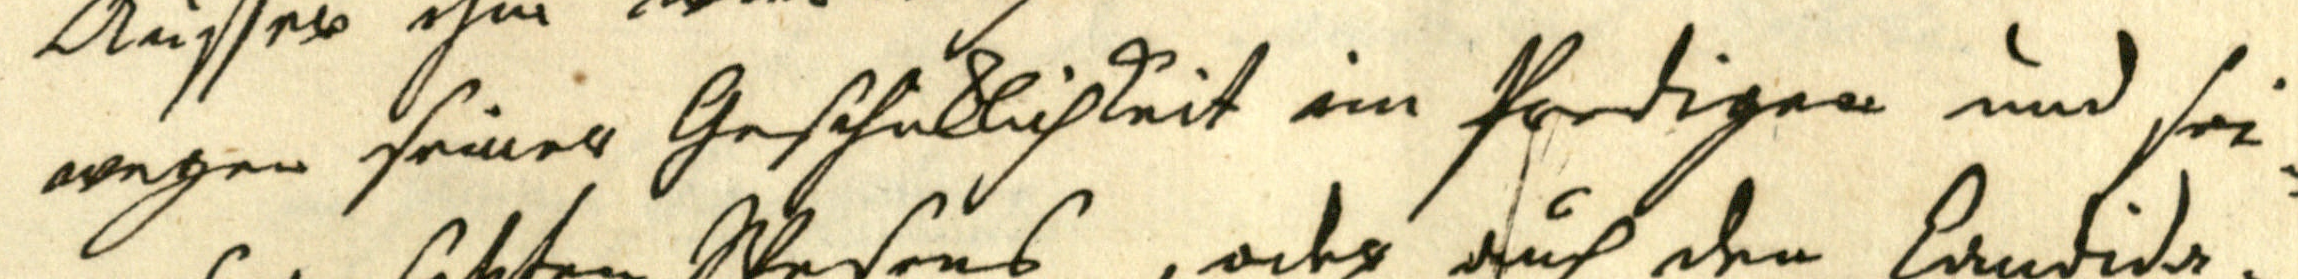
wegen seiner Geschicklichkeit im Predigen und sei¬
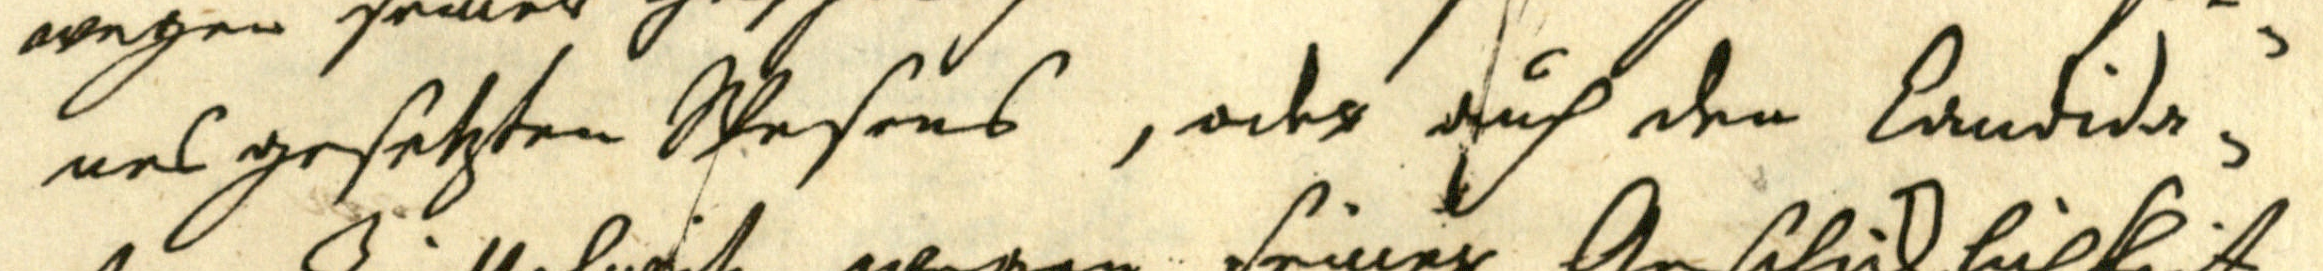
nes gesetzten Wesens, aber sauch den Candida¬
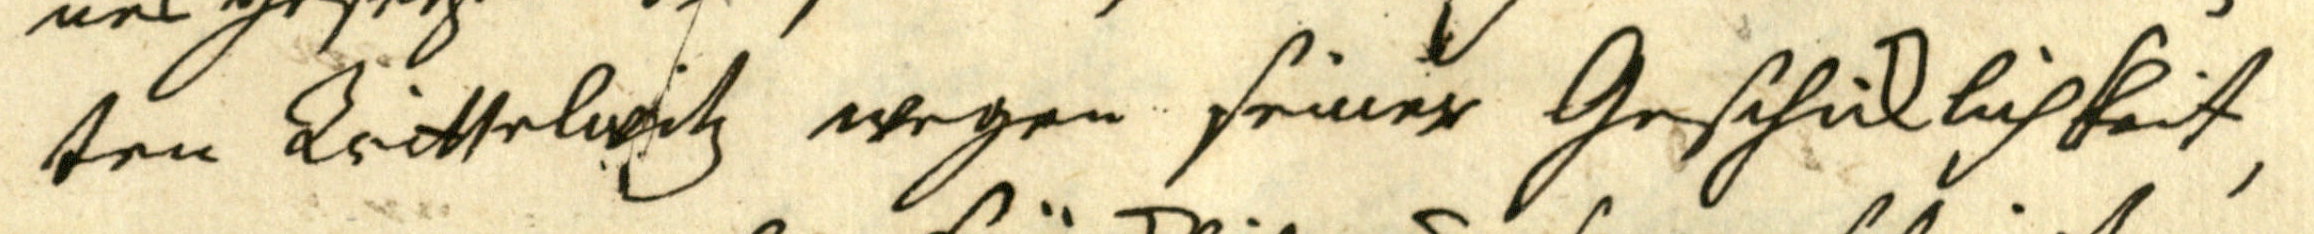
ten Trittelwitz wegen seiner Geschicklichkeit,
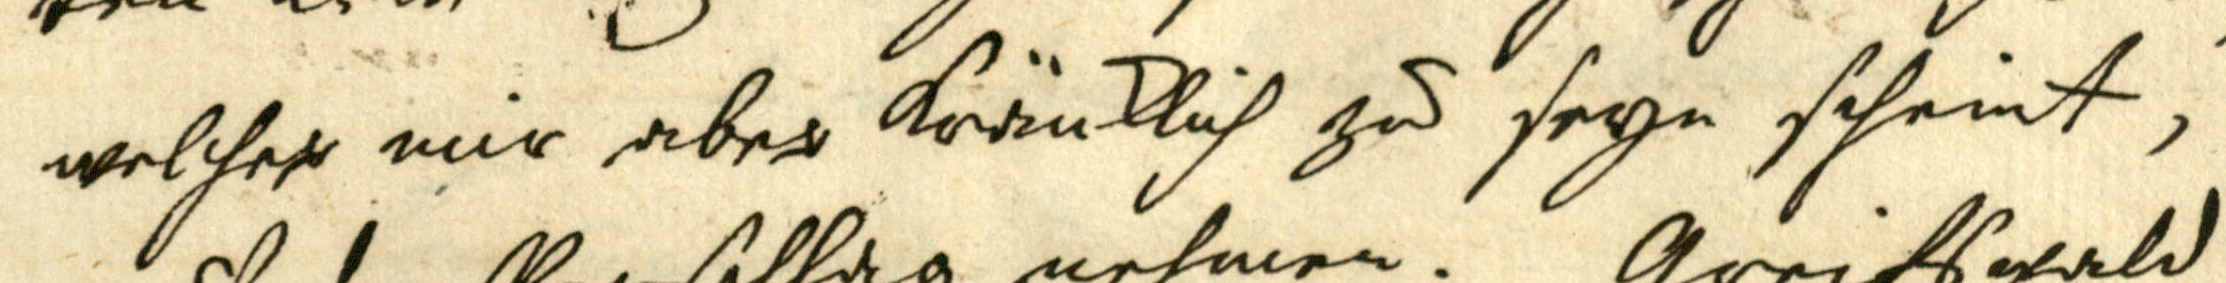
welcher mir aber käncklich zu seyn scheint,
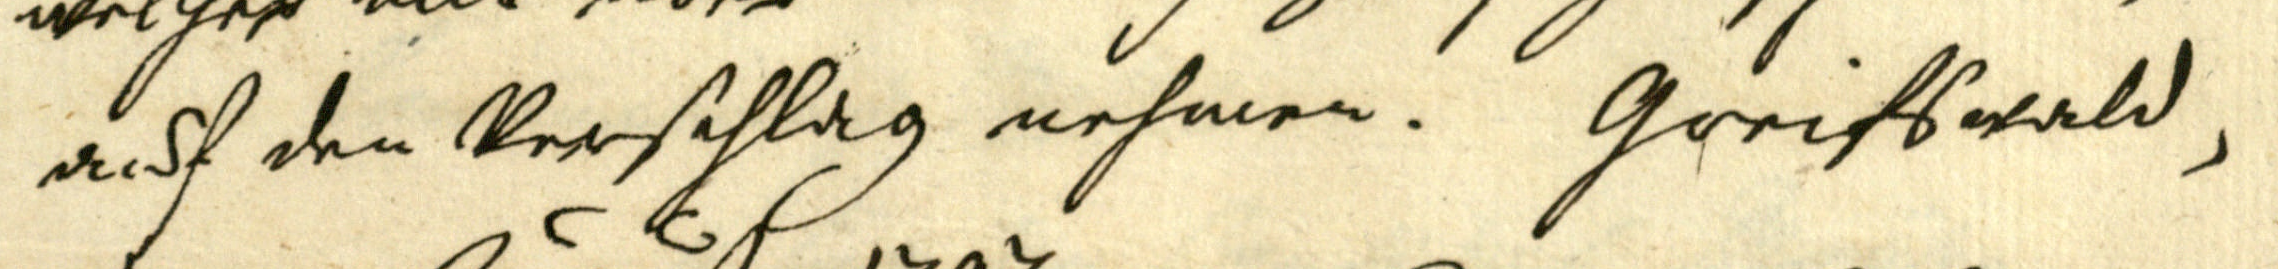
auf den Vorschlag nehmen. Greifswald,
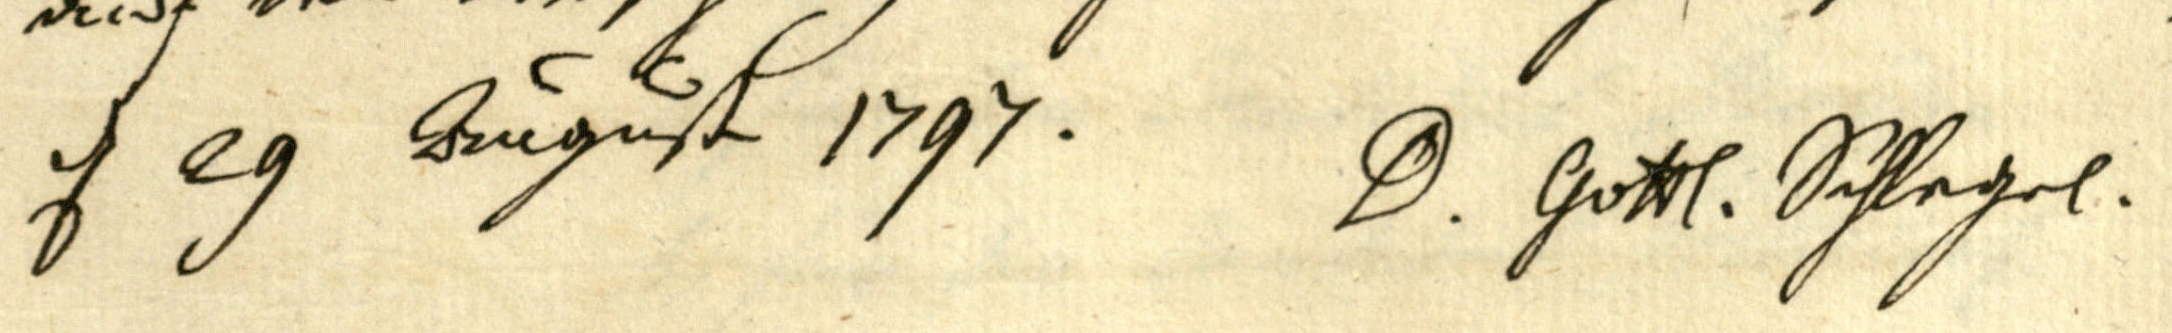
d 29 August 1797. D. Gottl. Schlegel.
